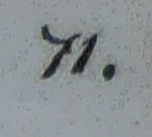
71.
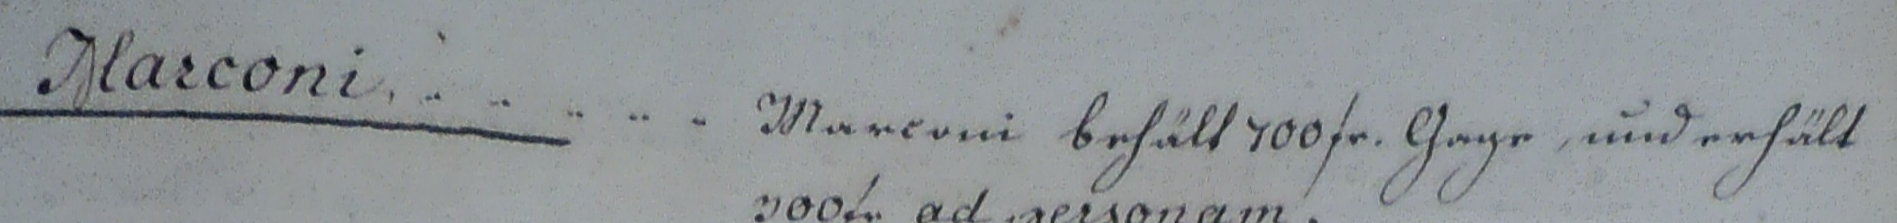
Marconi, .. .. .. .. .. Marcoini behält 700 fr. Gage, und erhält
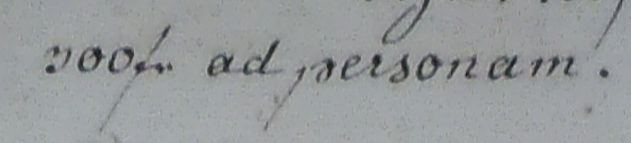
300fr ad personam.
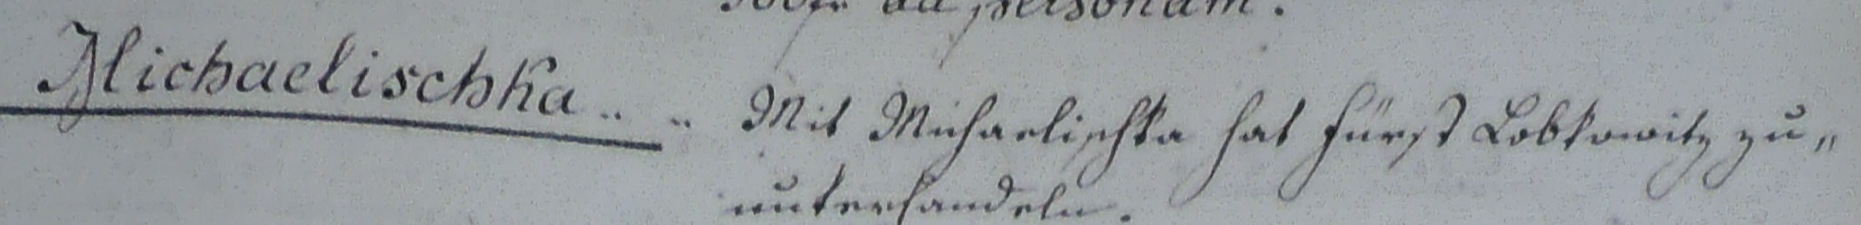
Michaelischke .. .. Mit Mihaelischka hat Fürst Lobkowitz zu¬
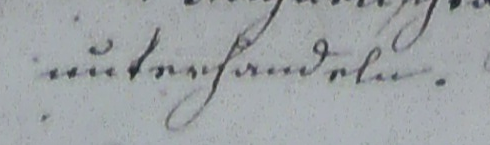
unterhandeln.
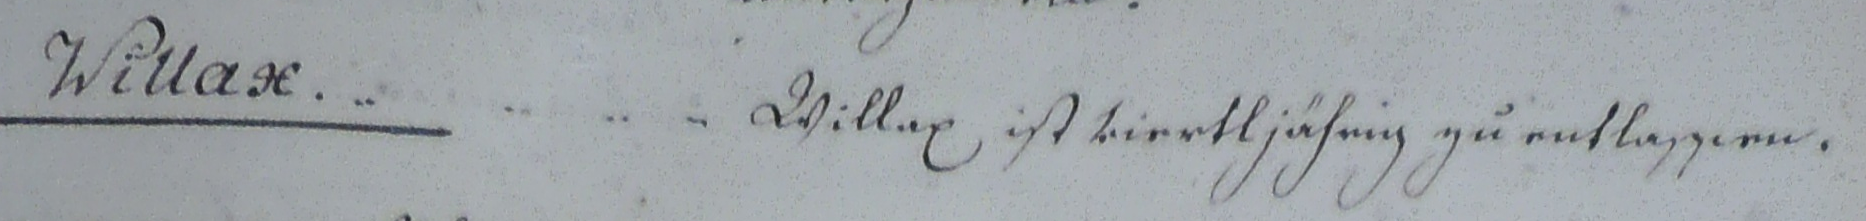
Willax . .. .. .. .. Willax, ist viertljächreng zu entlassen.
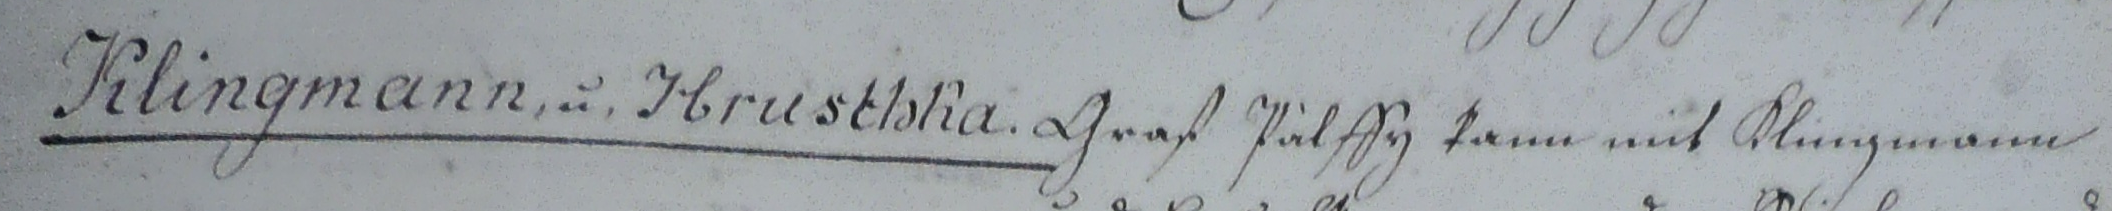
Klingmann, u. Hruschka. Graf Pàlffy kann mit Klingmann
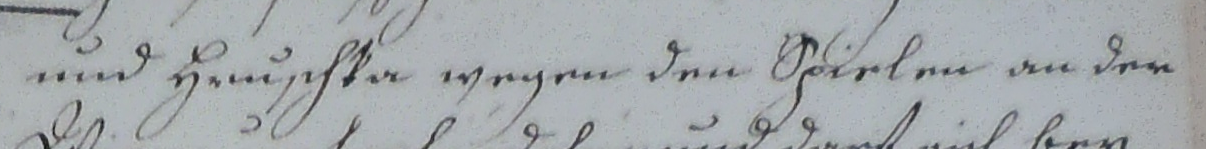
und Hruschka wegen den Spielen an der
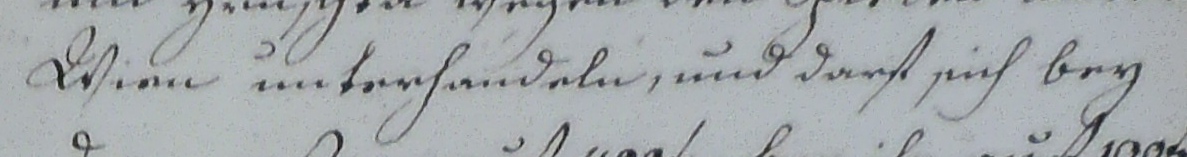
Wien unterhandeln, und darf sich bey
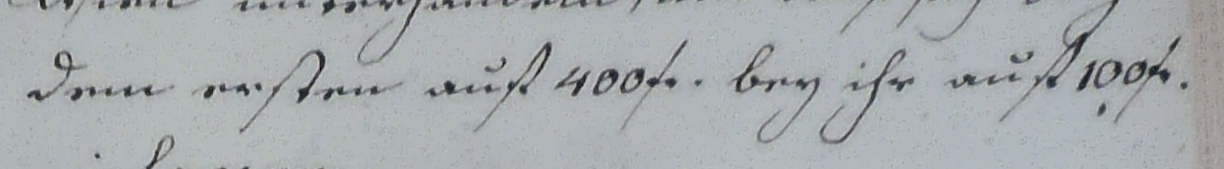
dem ersten auf 400fr. bey ihr auf 100f.
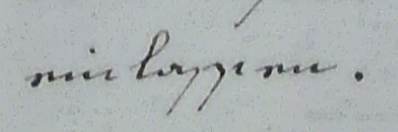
einlassen.
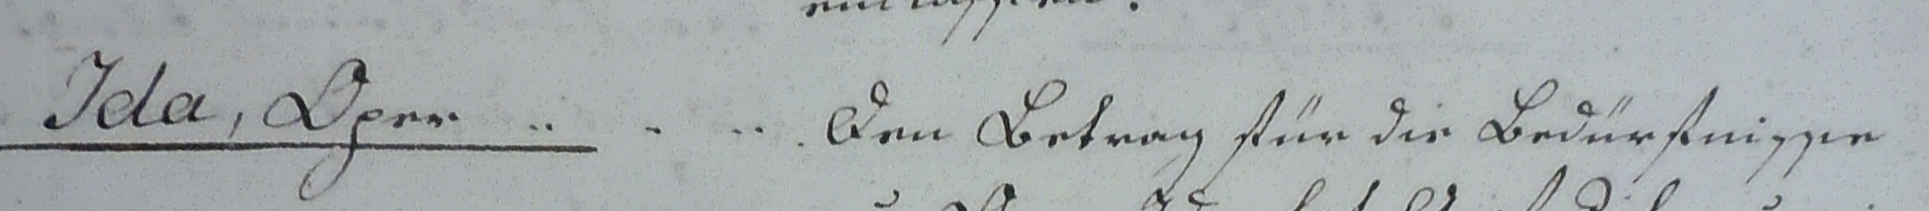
Ida, Oper .. .. .. Den Betrag für die Bedürfnisse
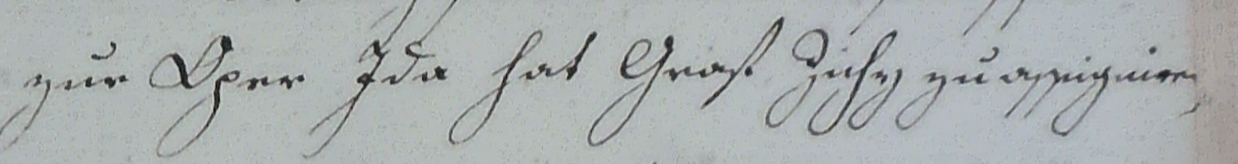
zur Oper Ida hat Graf Zichy zu assiziren.
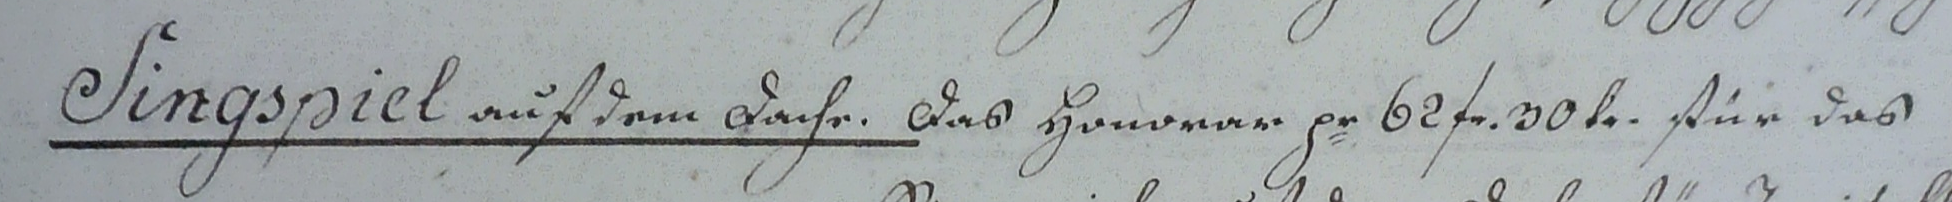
Singspiel auf dem Dache. Das Honorar pr̳ 61 fr. 30 kr. für das
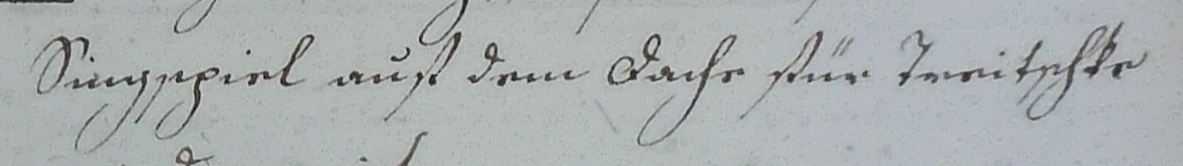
Singspiel auf dem Dache für Treitschke
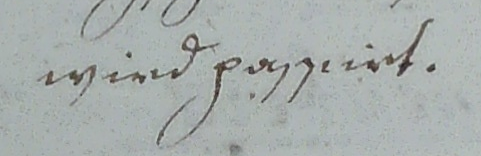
wird passirt.
